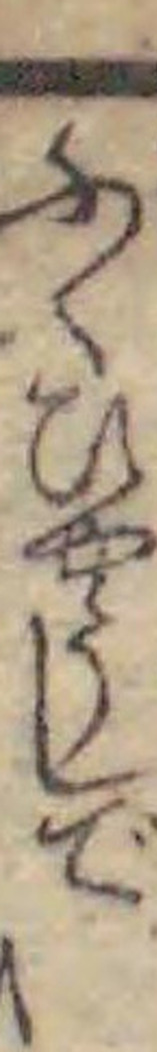ふくひやうしで
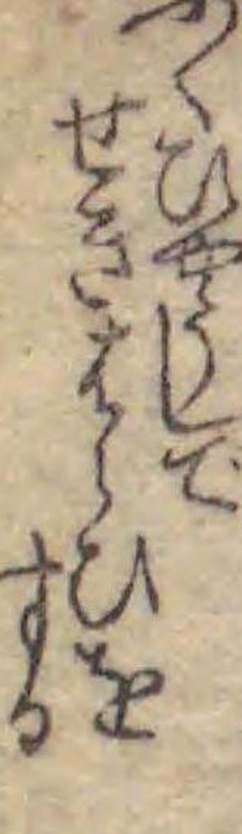せきはらひを

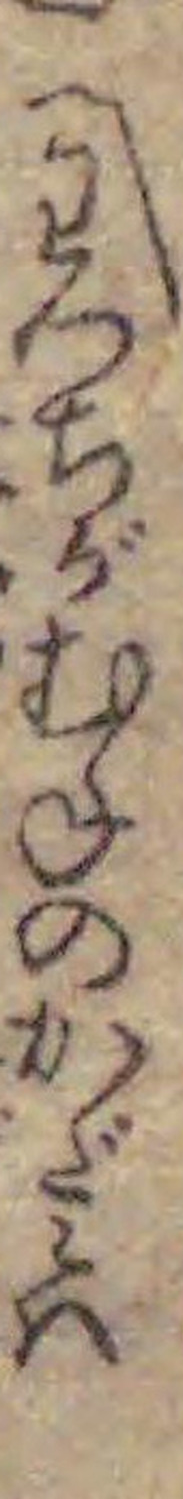〽わつちがむねのかゞみは
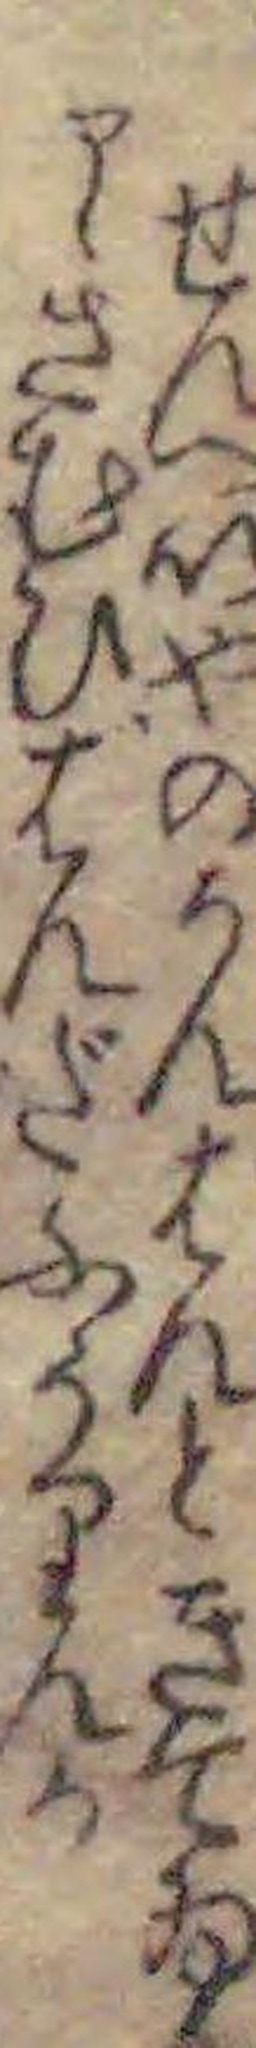アヽさむひはんだふうりんか
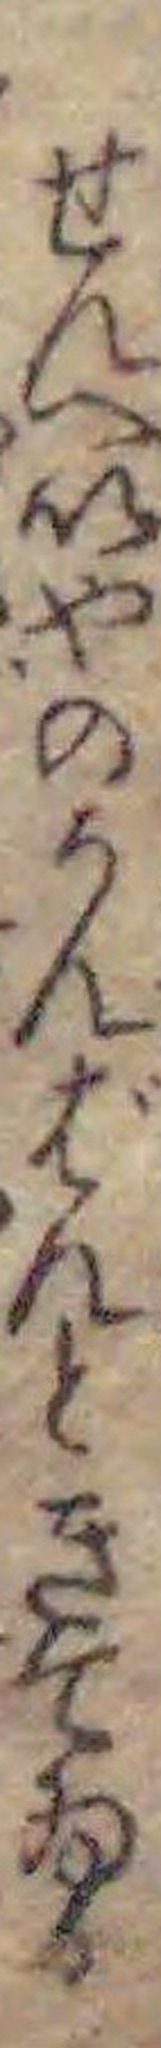せんへいやのかんばんときてゐる
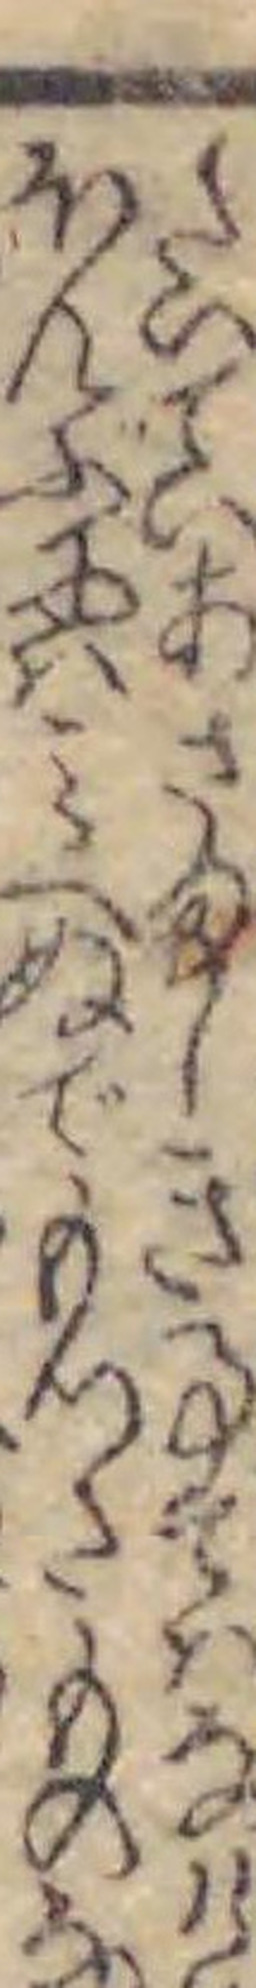ほんぶにはみへぬでもつたものなり
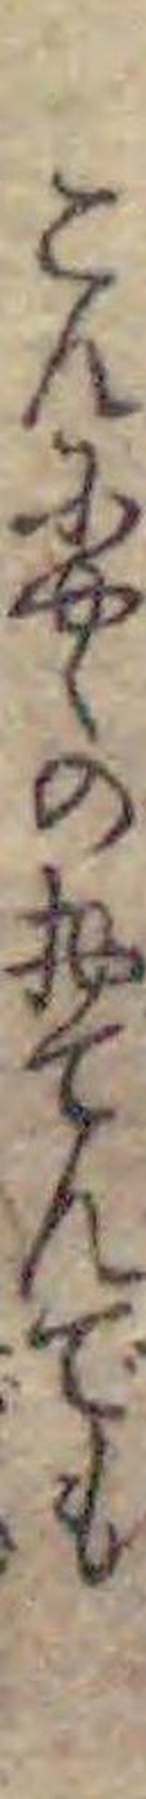こんにやくのおでんでも
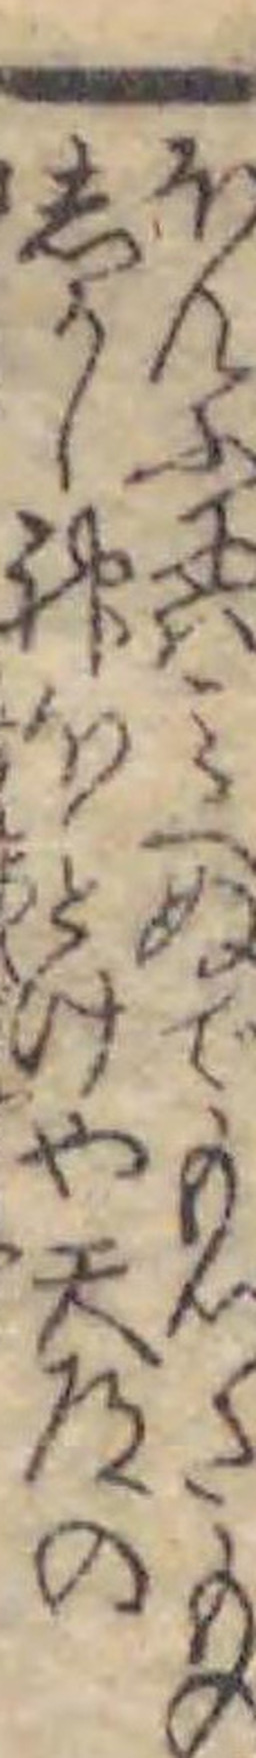しかし神ほとけや天道の
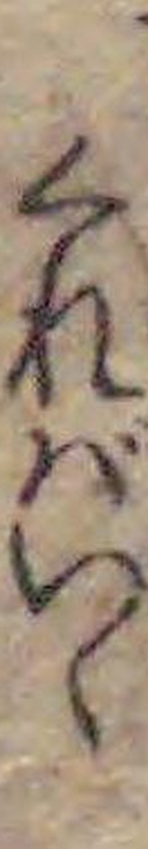くればいゝ
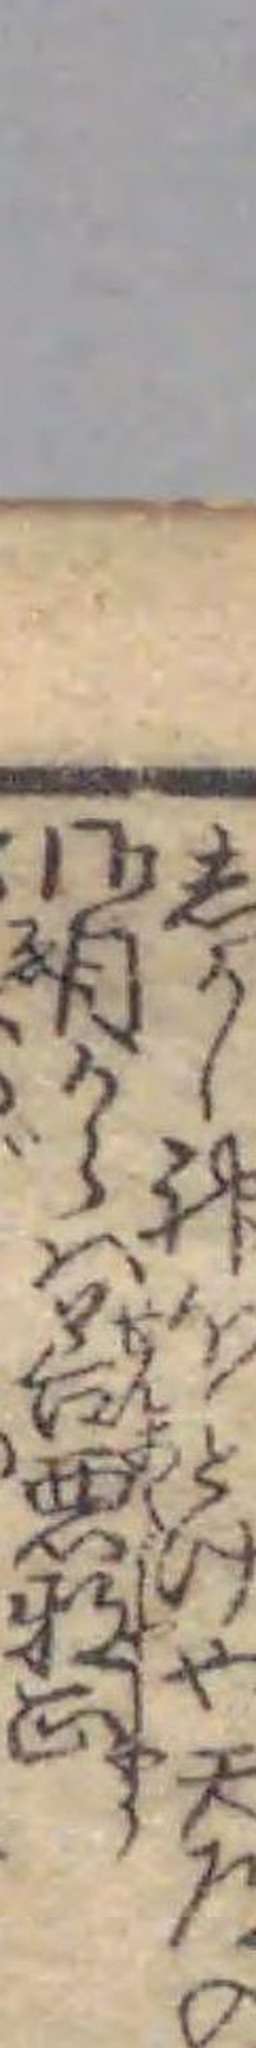御目からは善悪邪正
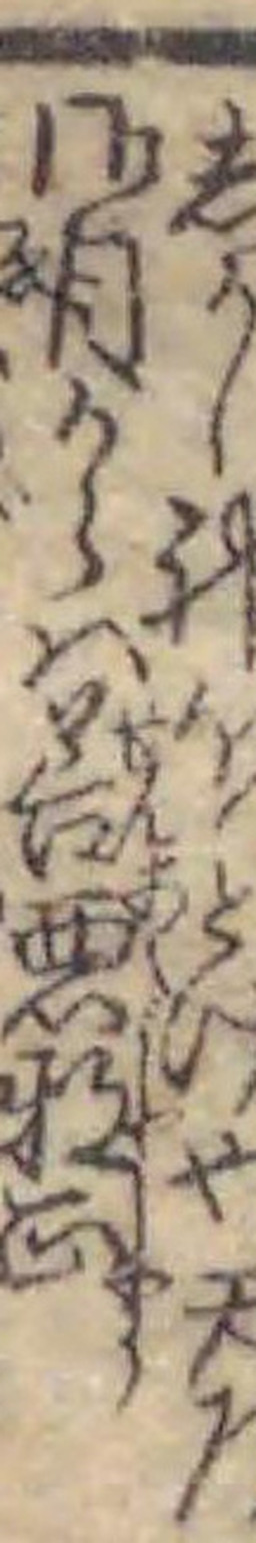御目からは善悪邪正
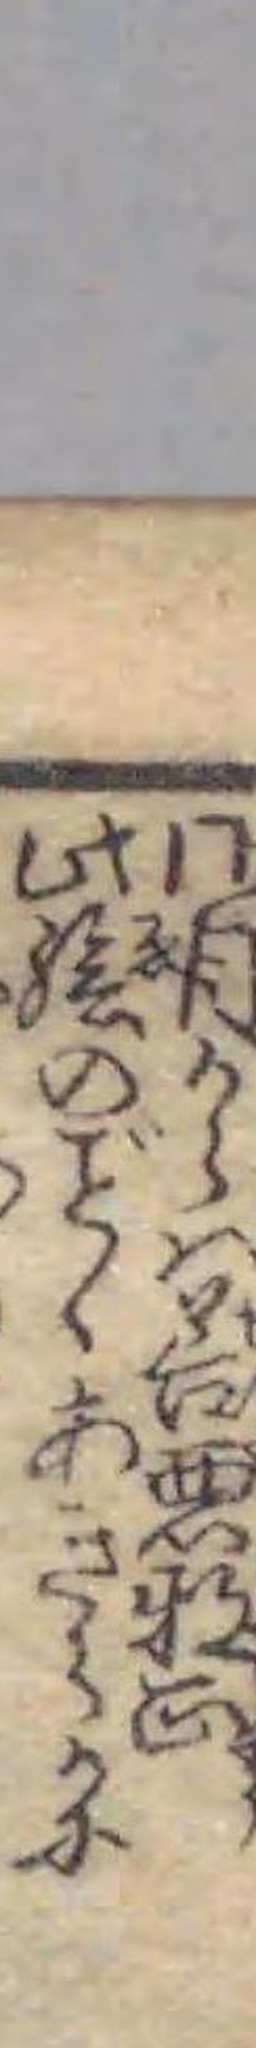此絵のごとくあきらかに
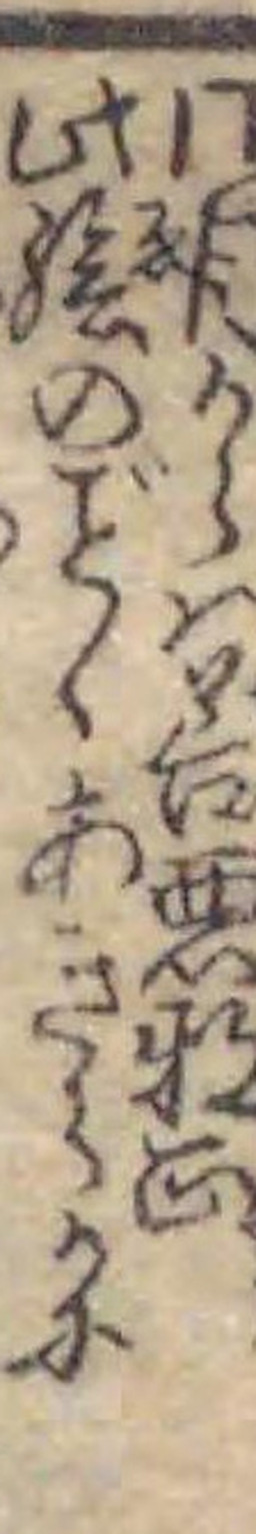此絵のごとくあきらかに
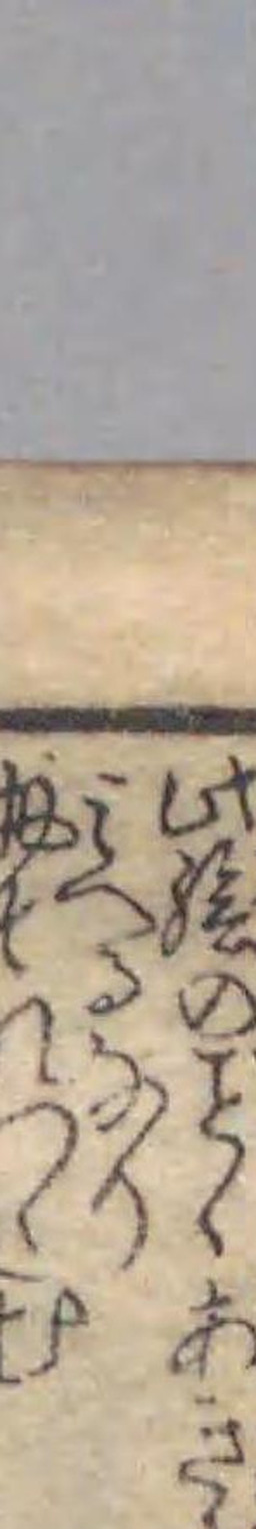おそれつゝしむ
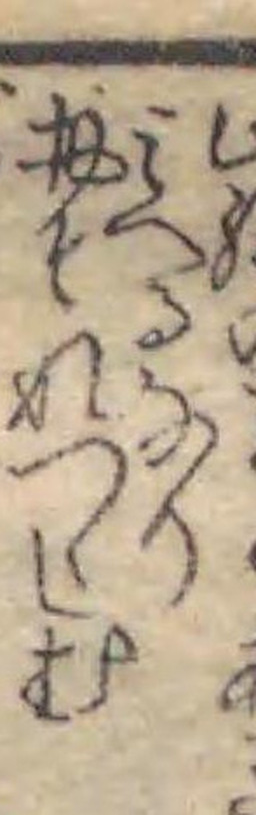おそれつゝしむ
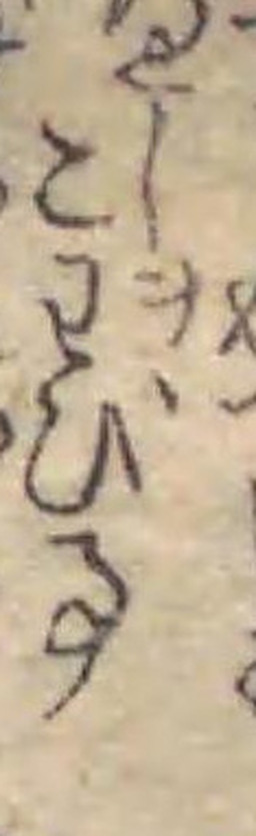こわひ事
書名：人心鏡写絵 : 3巻
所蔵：国立国会図書館 National Diet Library, JAPAN
